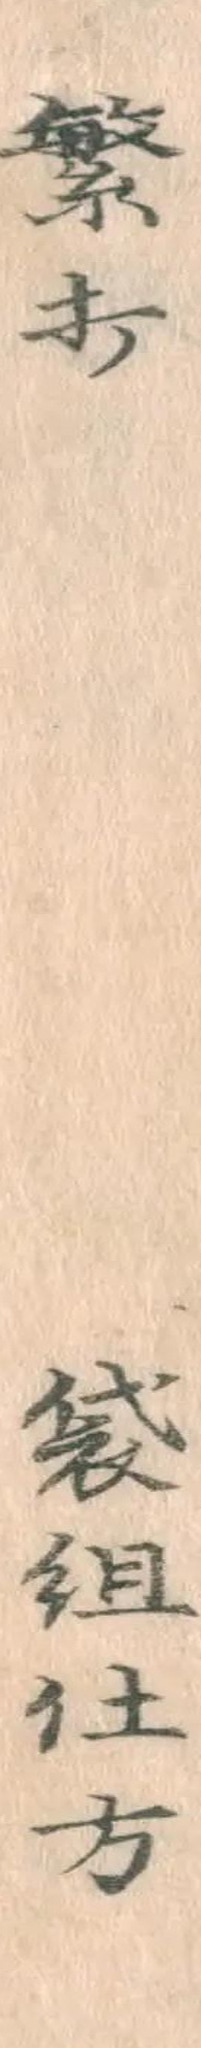繁打袋組仕方
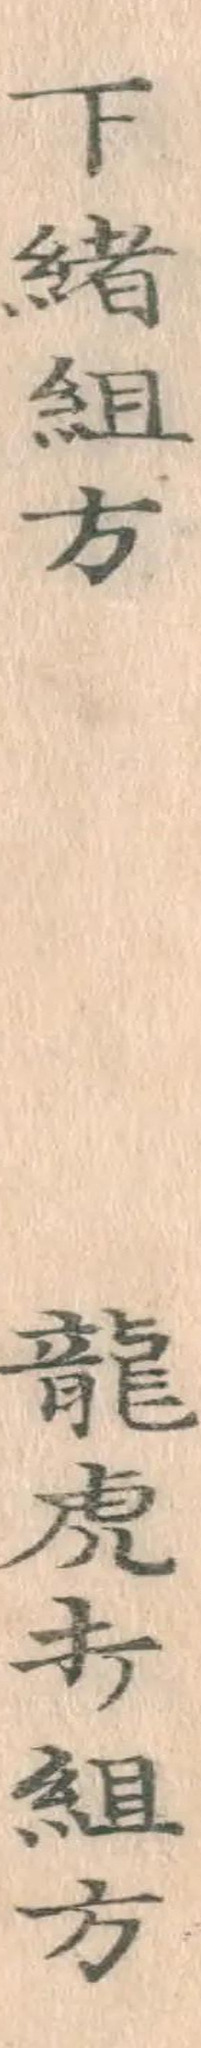下緒組方龍虎打組方
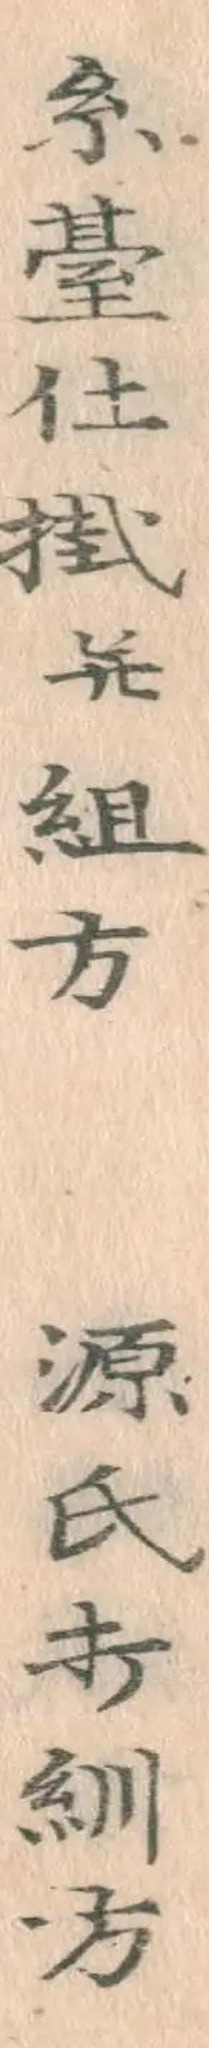糸台仕掛幷組方源氏打紃方
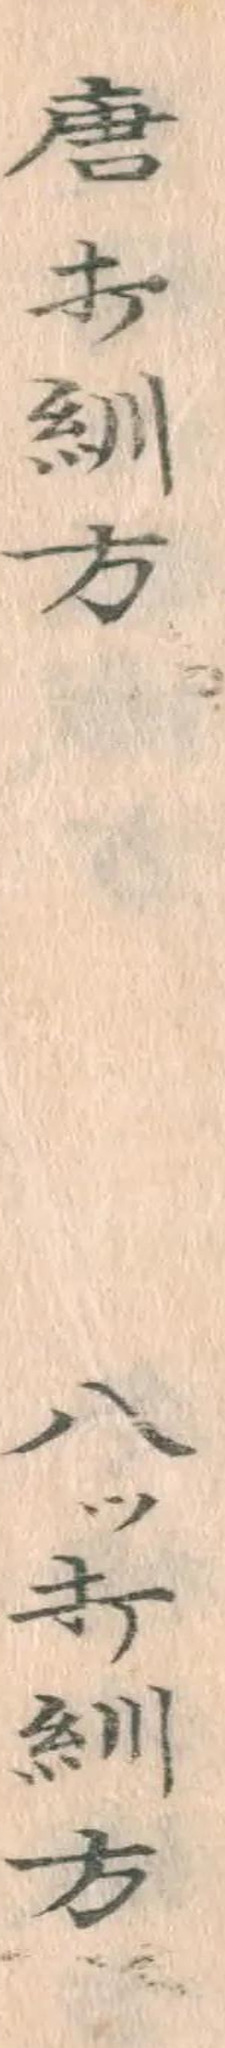唐打紃方八ッ打紃方
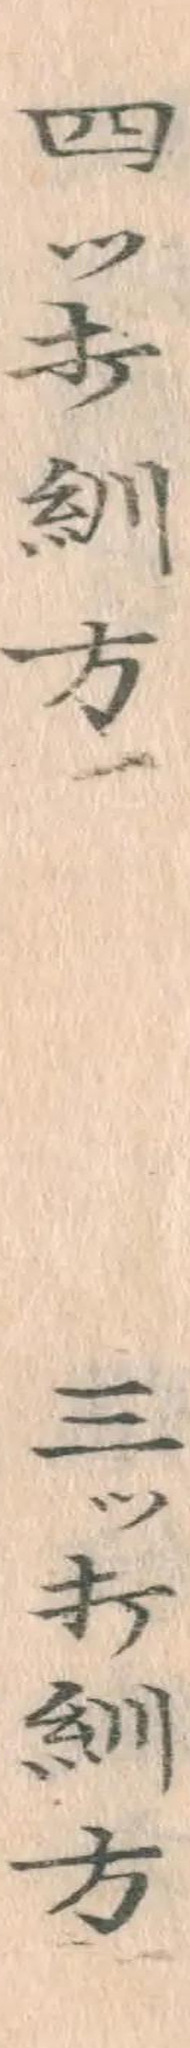四ッ打紃方三ッ打紃方
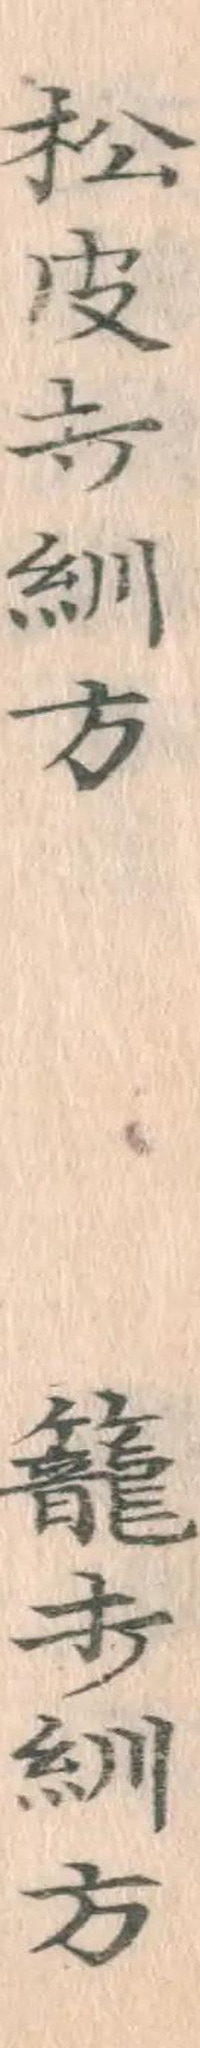松皮打紃方籠打紃方
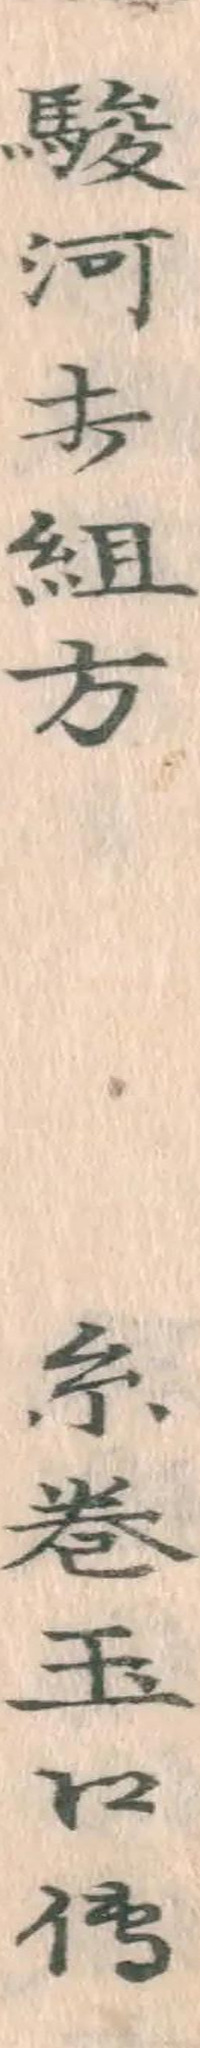駿河打組方糸巻玉口伝
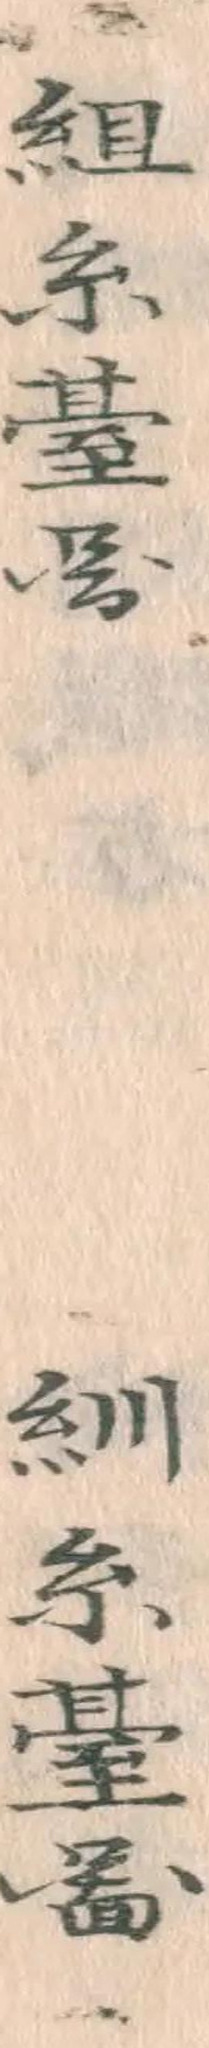組糸台図紃糸台図
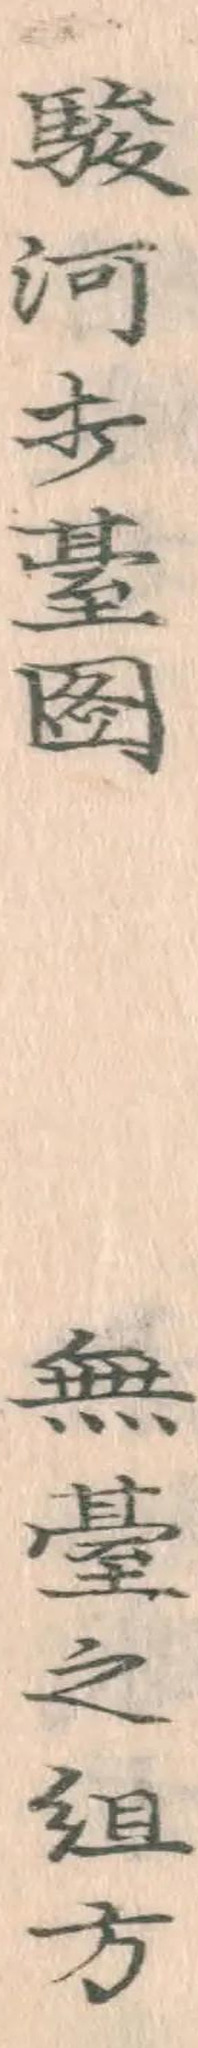駿河打台図無台之組方
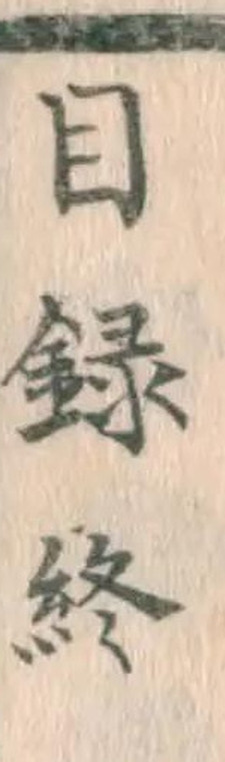目録終
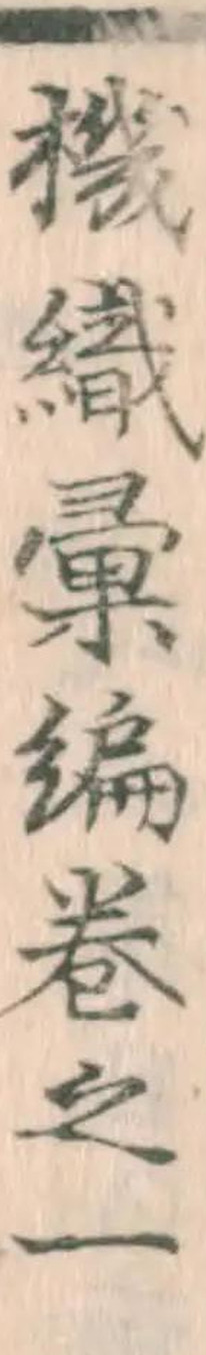機織彙編巻之一
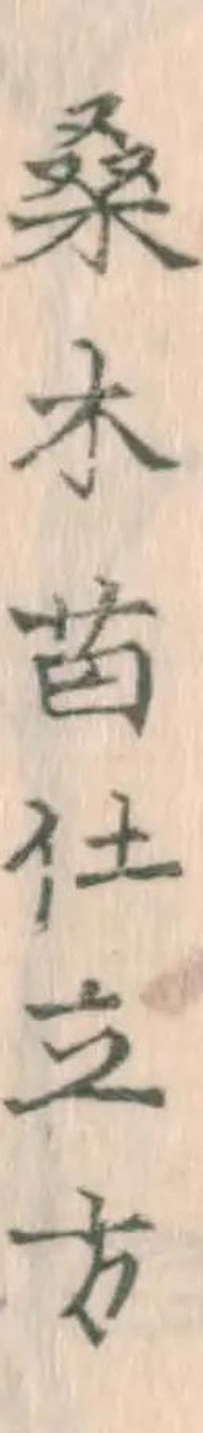桑木苗仕立方
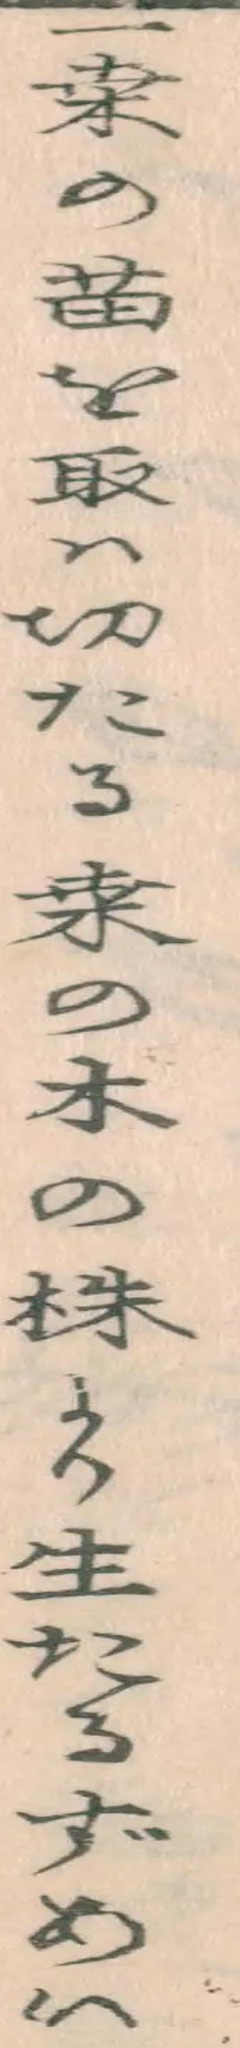一桑の苗を取は切たる桑の木の株より生たるずあい
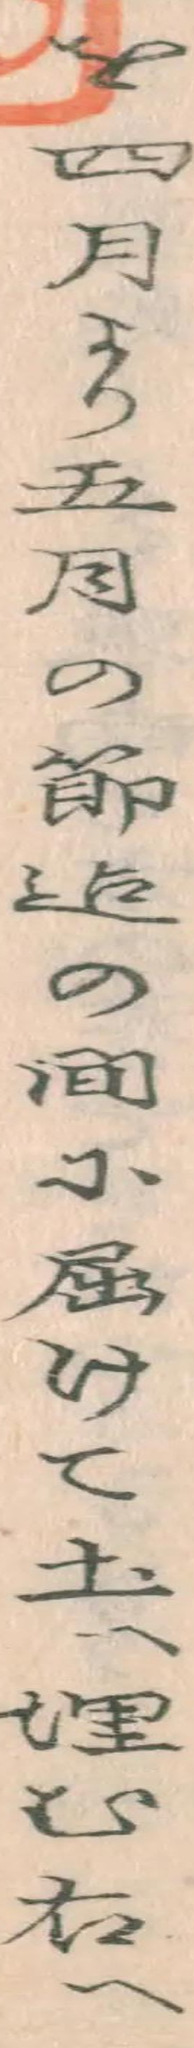を四月より五月の節迄の間に屈けて土へ埋む右へ
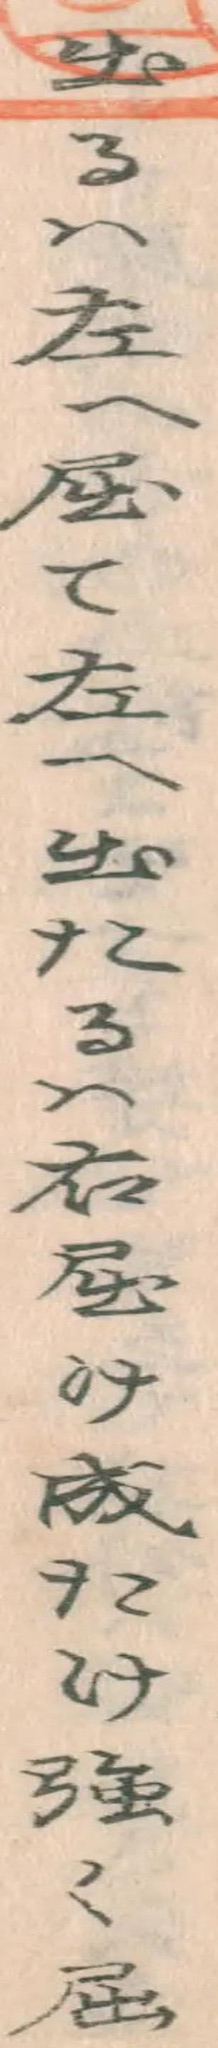出るは左へ屈て左へ出たるは右屈け成たけ強く屈
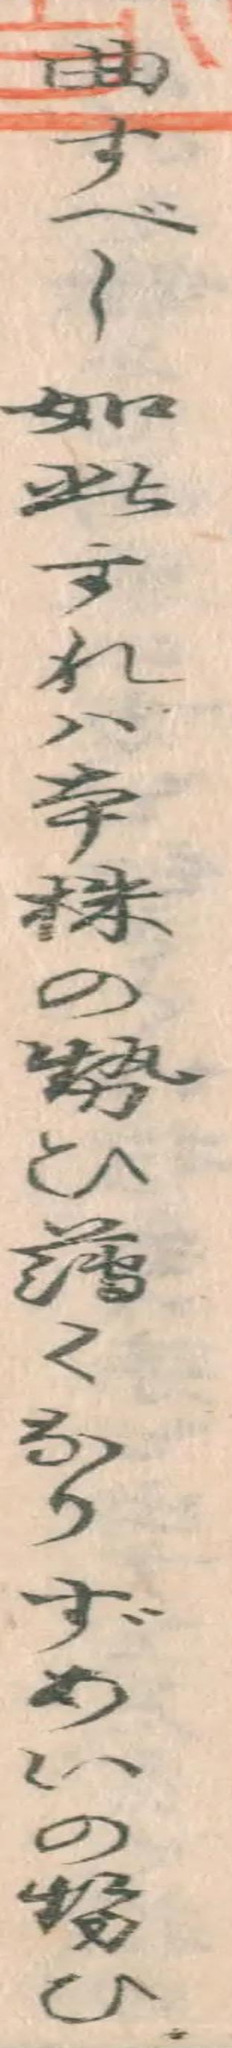曲すべし如此すれは本株の勢ひ薄くなりずあいの勢ひ
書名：機織彙編 5巻. [1]
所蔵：国立国会図書館 National Diet Library, JAPAN
